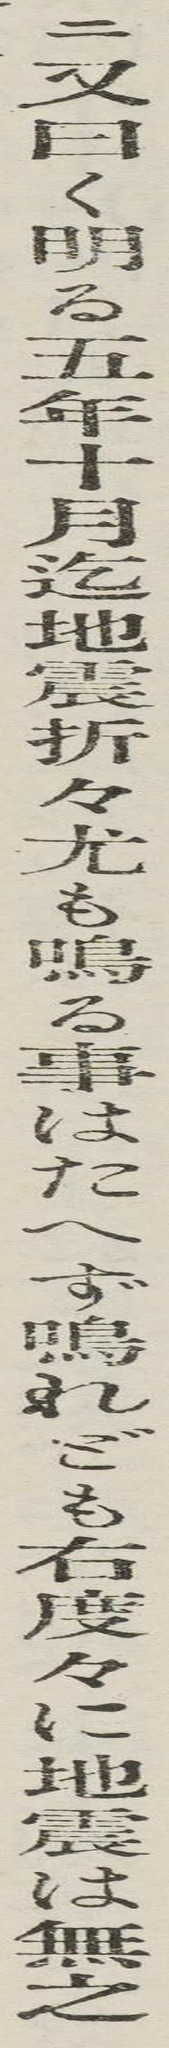又曰く明る五年十月迄地震折々尤も鳴る事はたへず鳴れども右度々に地震は無之
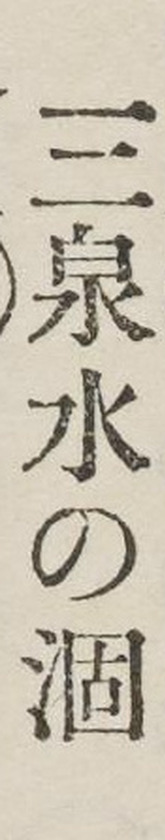㈢泉水の涸
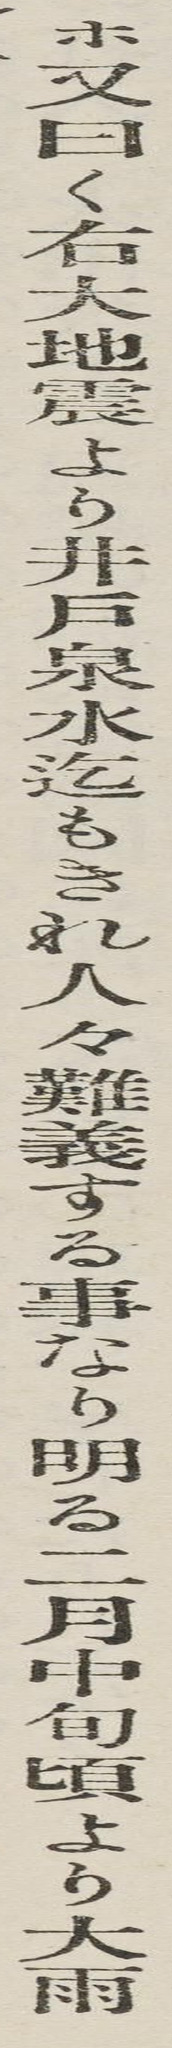又曰く右大地震より井戸泉水迄もきれ人々難義する事なり明る二月中旬頃より大雨
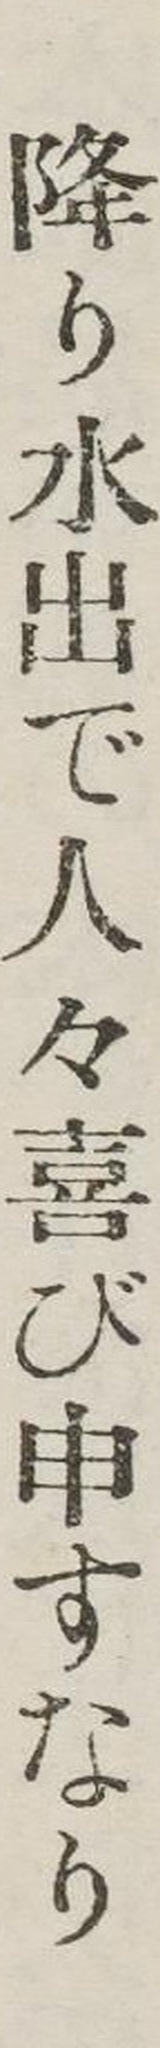降り水出で人々喜び申すなり
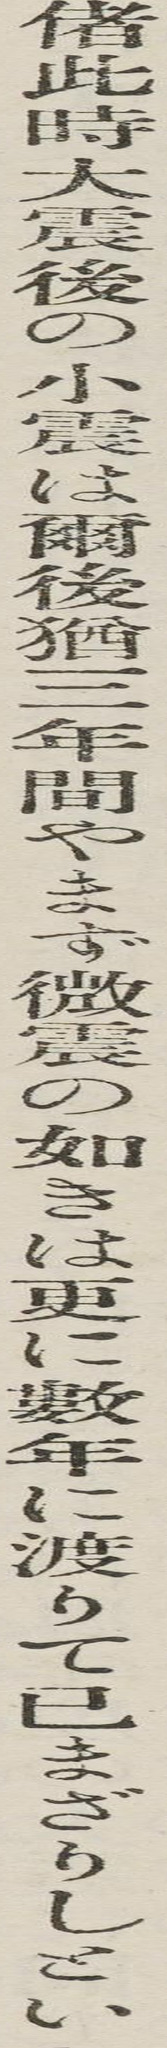偖此時大震後の小震は爾後猶三年間やまず微震の如きは更に数年に渡りて已まざりしとい
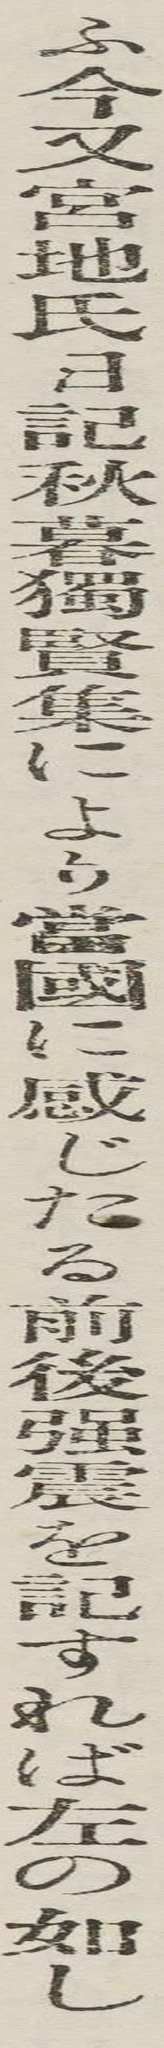ふ今又宮地氏日記秋暮独賢集により当国に感じたる前後強震を記すれば左の如し
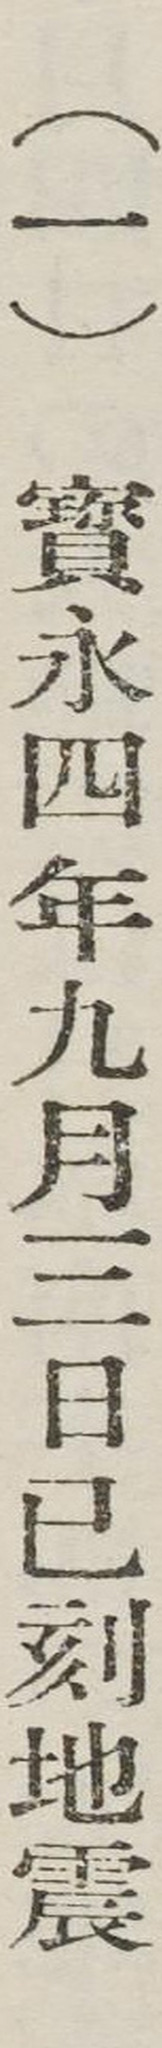宝永四年九月三日巳刻地震
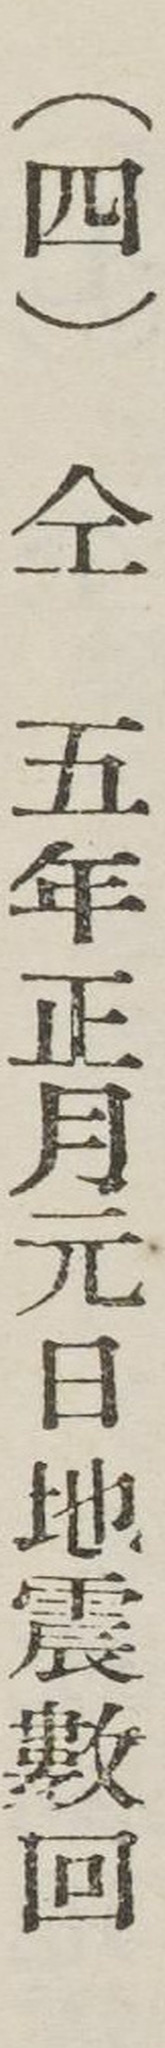同五年正月元日地震数回
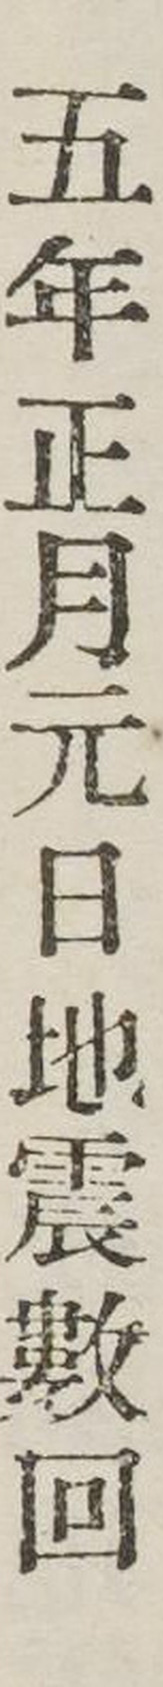同五年正月元日地震数回

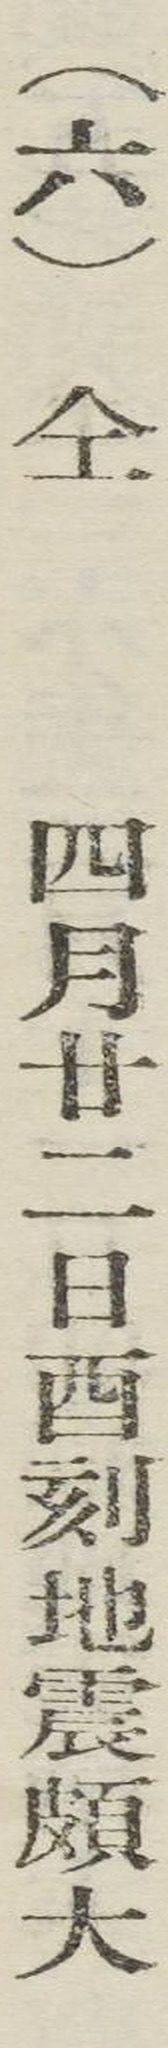同四月廿二日酉刻地震頗大
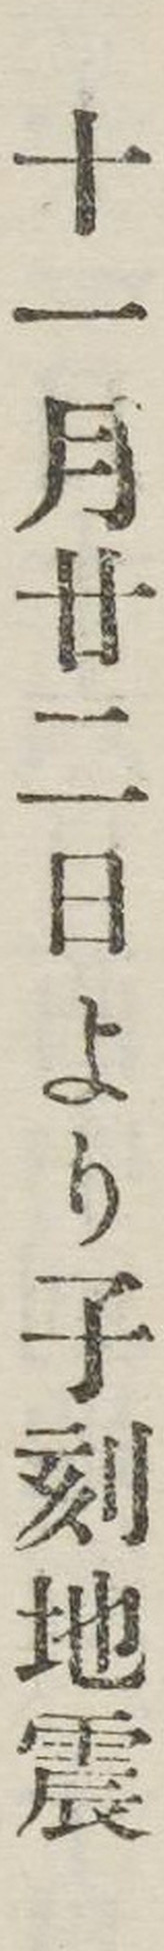同十一月廿二より子刻地震
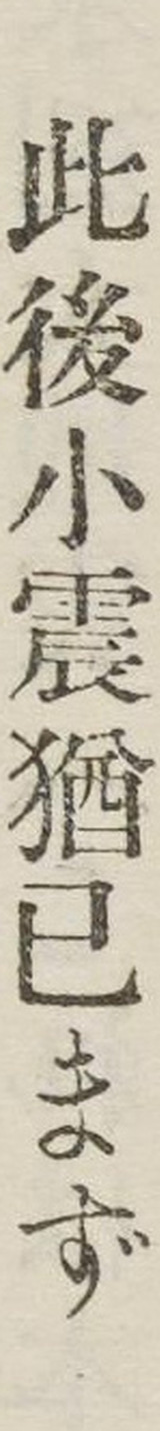此後小震猶已まず
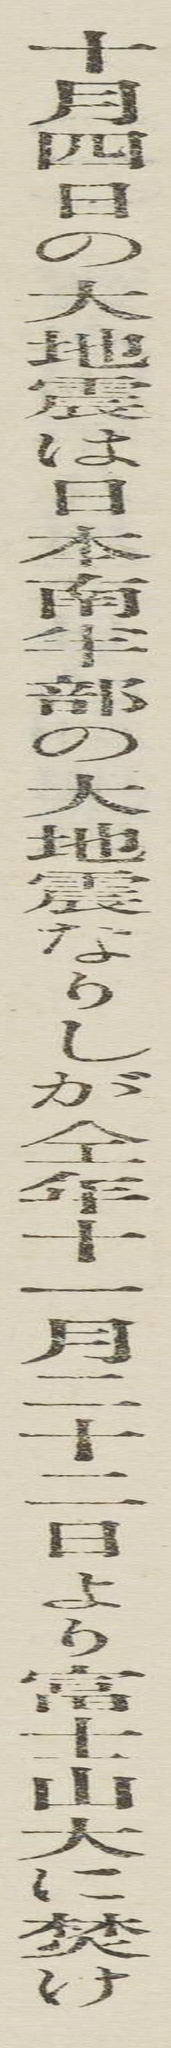十月四日の大地震は日本南半部の大地震なりしが同年十一月二十二日より富士山大に焚け
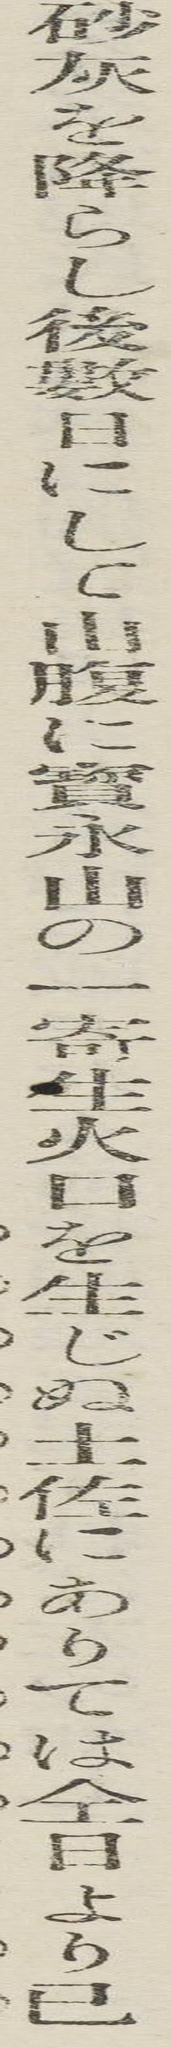砂灰を降らし後数日にして由腹に宝永山の一寄生火口を生じぬ土佐にありては同日より已
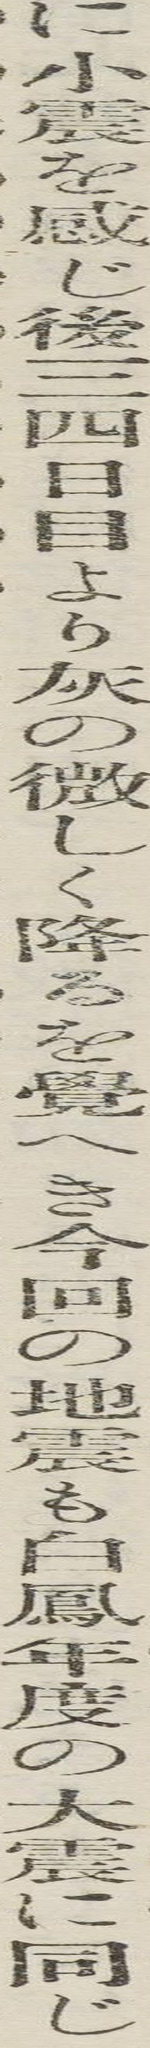に小震な感じ後三四日目より灰の微しく降るを覚へき今回の地震も白鳳年度の大震に同じ
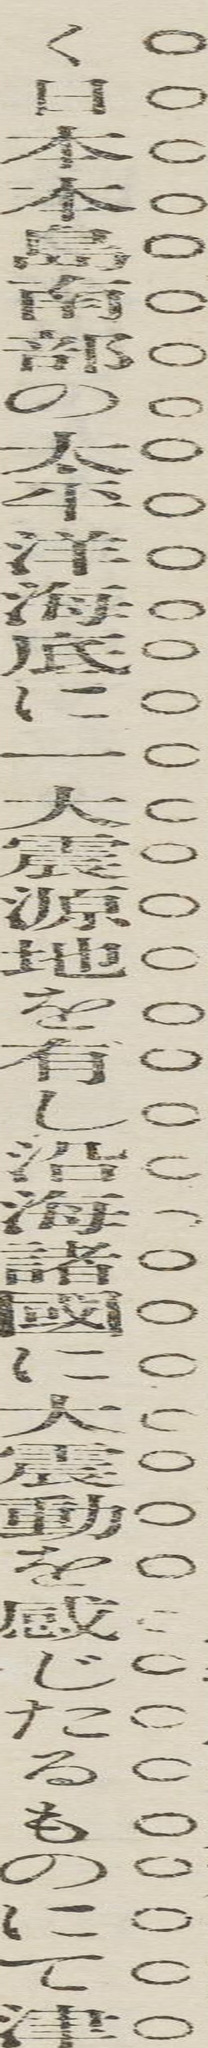く日本本島南部の太平洋海底に一大震源地な有し沿海諸国に大震動を感じたるものにて津
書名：土佐古今ノ地震
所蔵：東京大学地震研究所図書室 Earthquake Research Institute Library, The University of Tokyo, JAPAN
